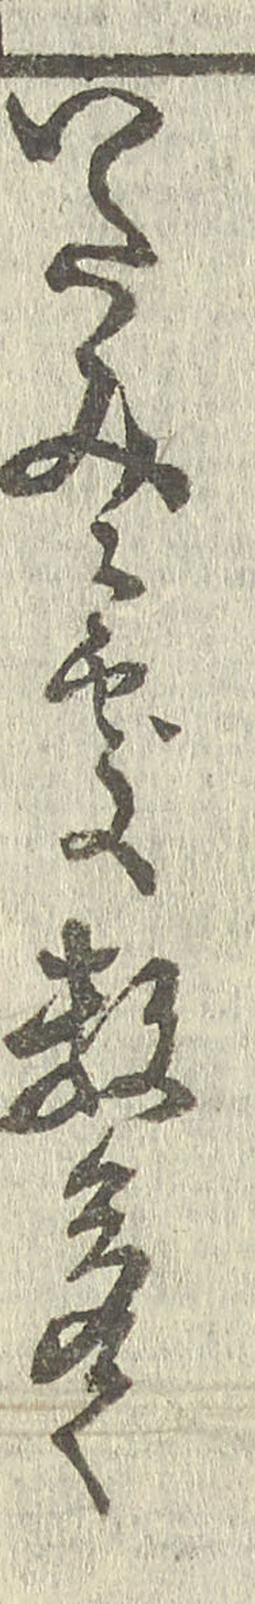いたみ候處数多く
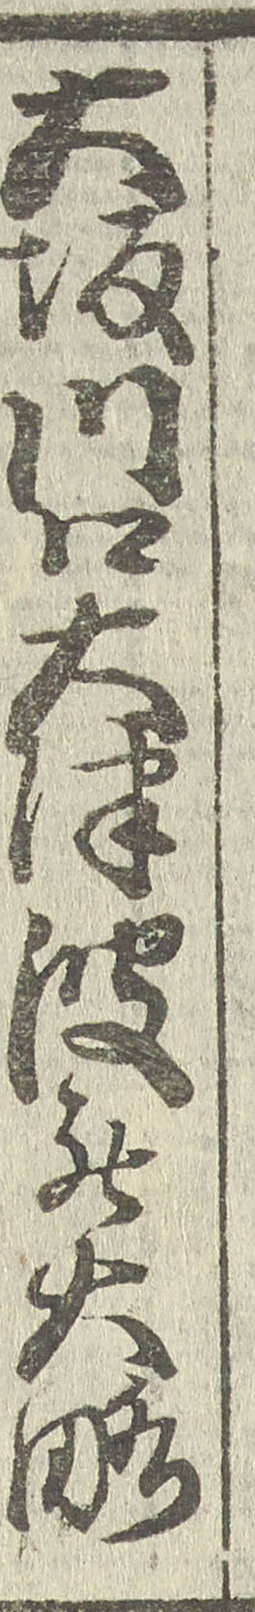大坂川口大津波の大略
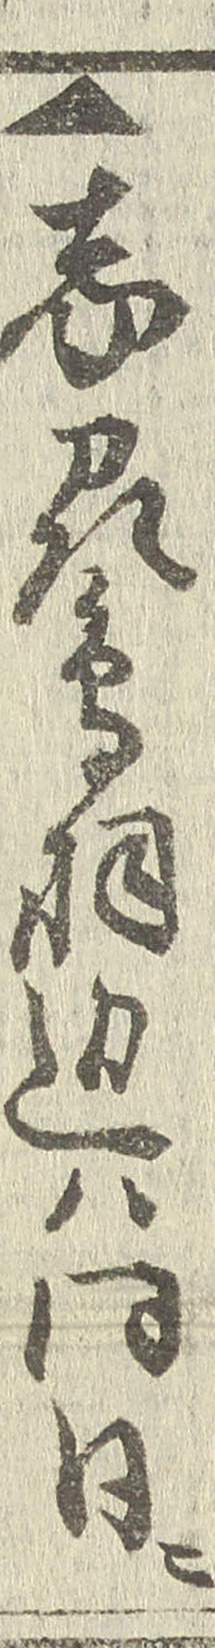▲志州鳥羽辺は同日に
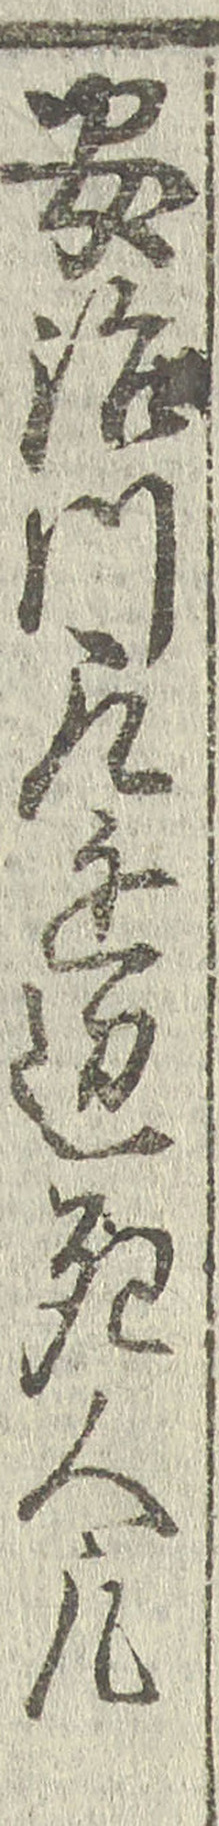安治川凡近辺死人凡
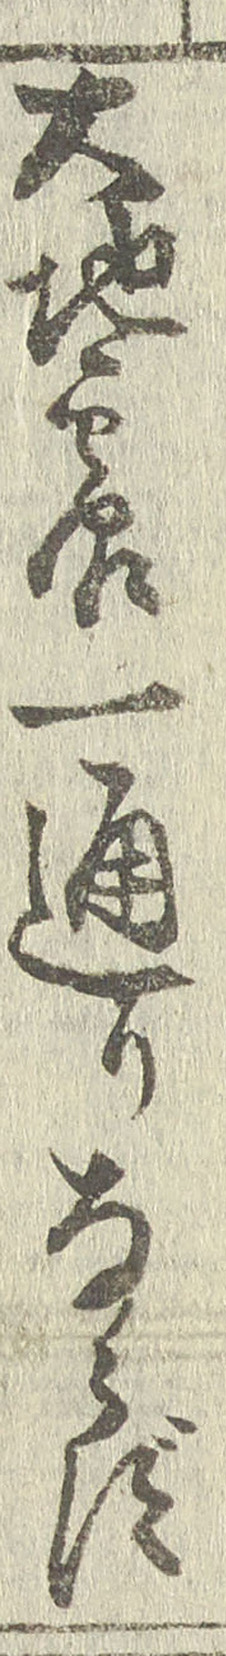大地震一通りならず
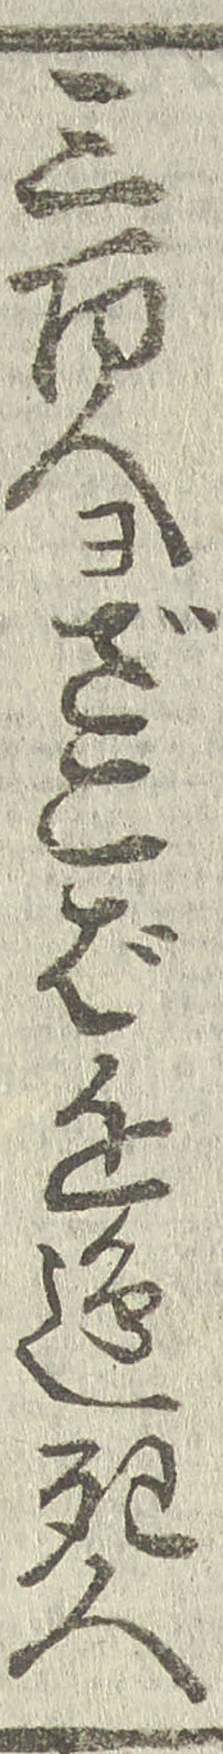三百人よざこば近辺死人
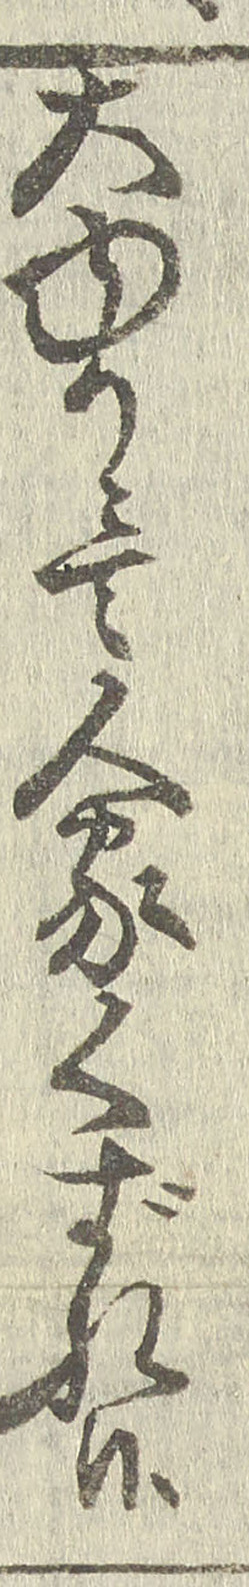大ゆりにて人家くずれ候
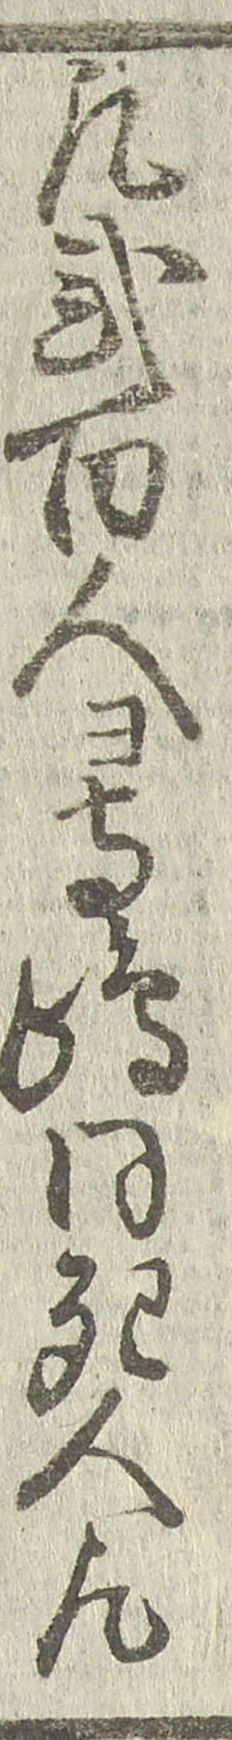凡弐百人ヨ寺嶋同死人凡
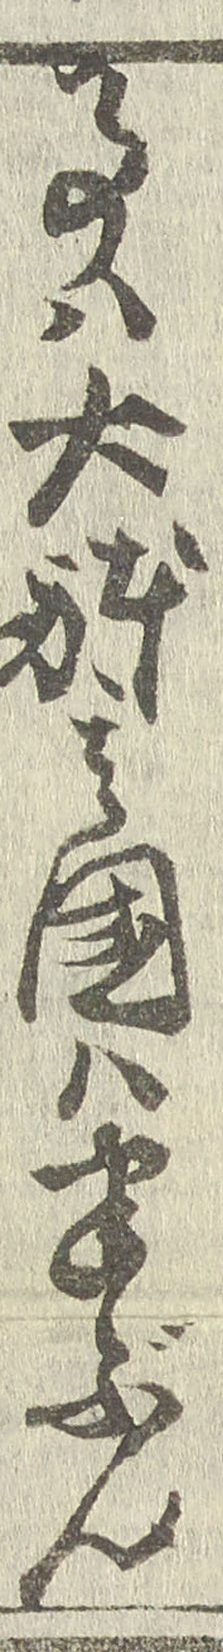事は大躰其因は半ぶん
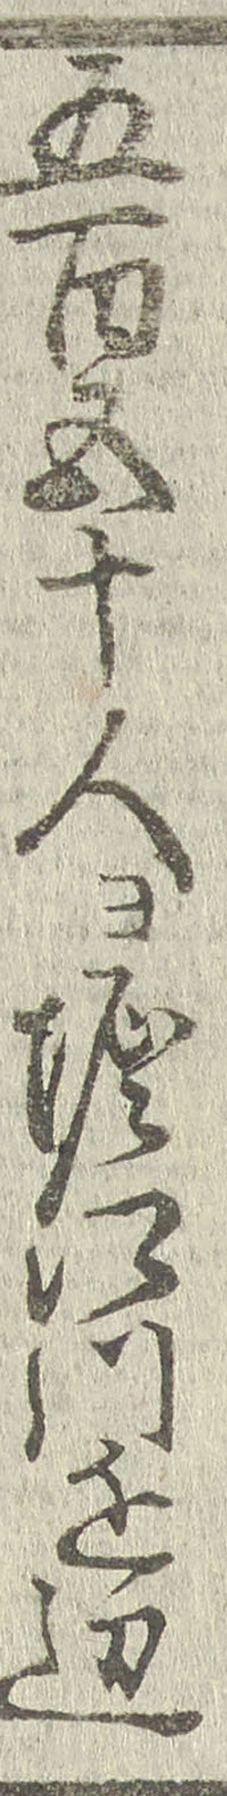五百五十人よ堀江川近辺
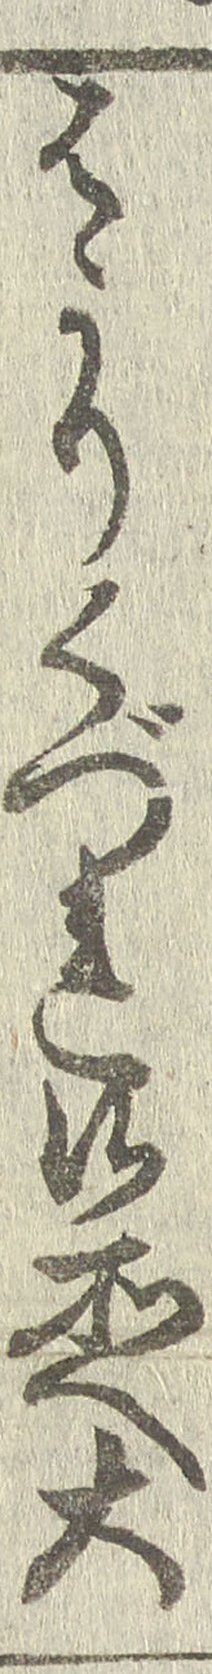はかりくづれ候所へ大
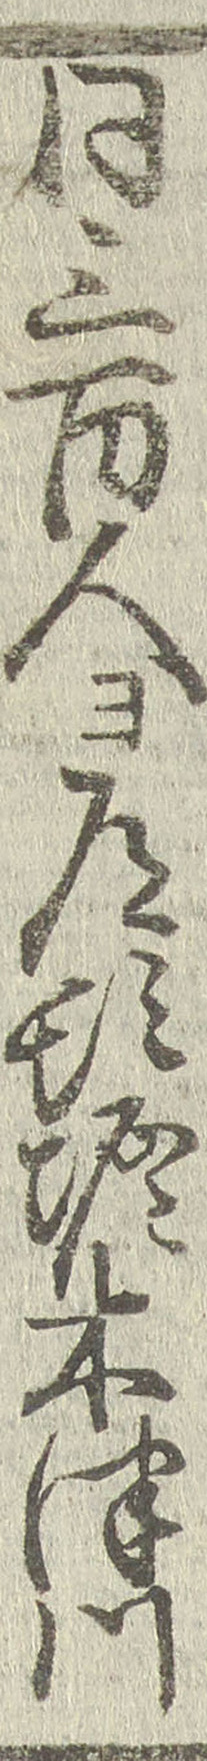同三百人余道頓堀木津川
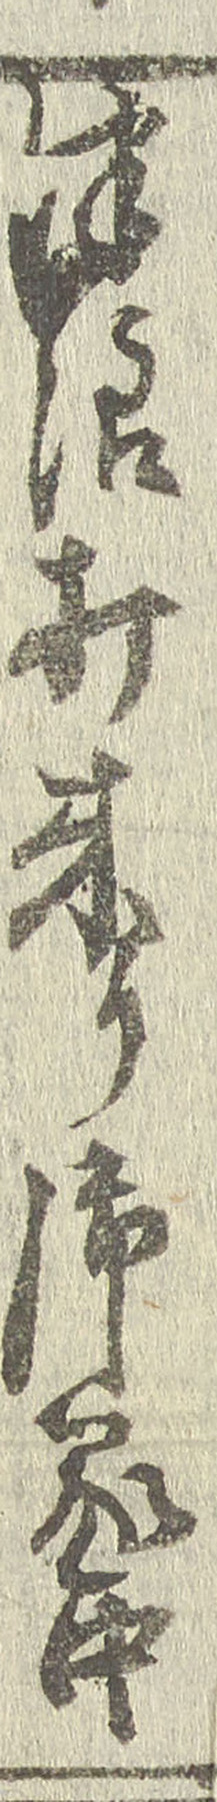つ浪打来り御家中
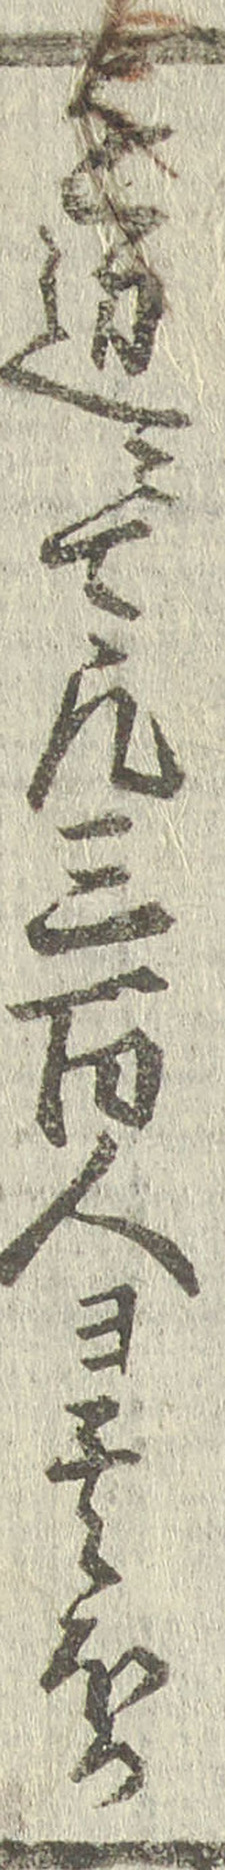近辺にて凡三百人よ其ほか
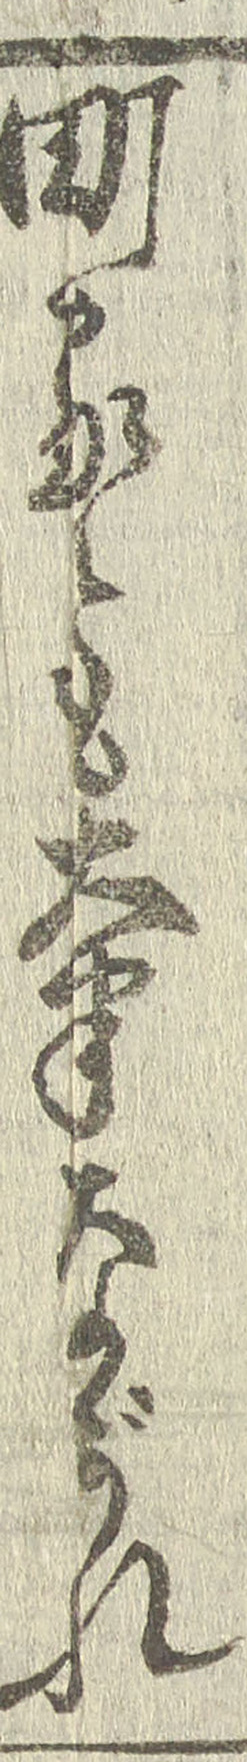町家とも大半ながれ
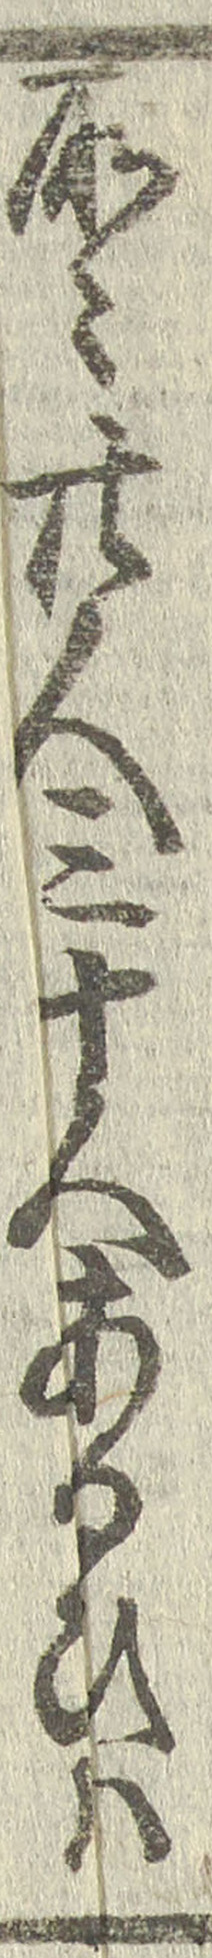所々廿人三十人あるひは
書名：諸国大地震大津波 三編
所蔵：東京大学総合図書館 General Library in the University of Tokyo, JAPAN
